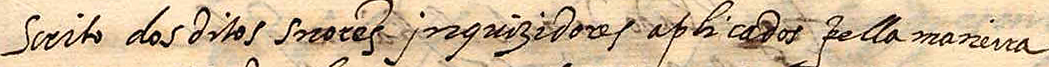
Scrito dos ditos snorēs jnquizidores aplicados pella maneira
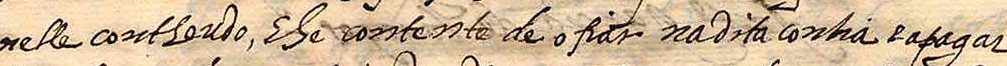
nelle contheudo, E he contente de o fiar na dita contia e apagar
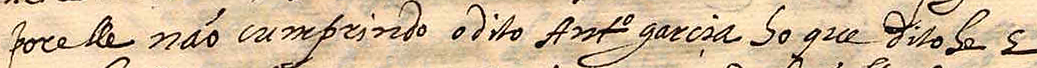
por elle não cumprindo o dito Anto garçia ho que dito he E
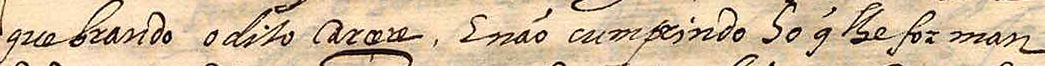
quebrando o dito carçere, E não cumprindo ho q̄ lhe for man
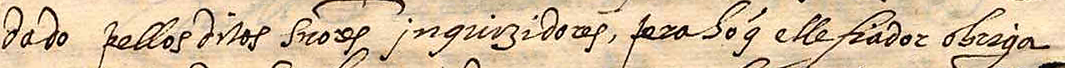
dado pellos ditos snōres jnquizidores, pera ho q̄ elle fiador obriga
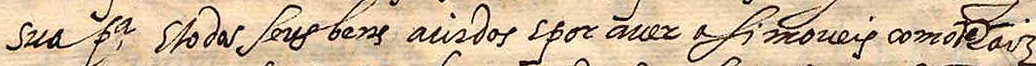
sua pa. E todos seus bens auidos E por auer asi moueis como de Raiz
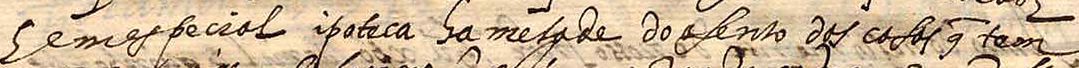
E em espeçial ipoteca ha metade do asento das casas q̄ tem
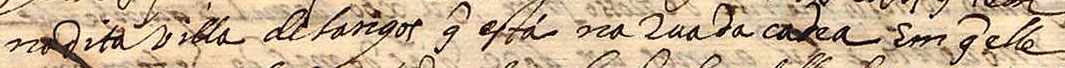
na dita villa de tanqos q̄ está na Rua da cadea Em q̄ elle
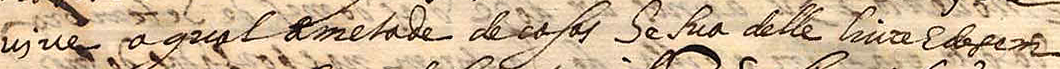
uiue a qual ametade de casas he sua delle liure E desen
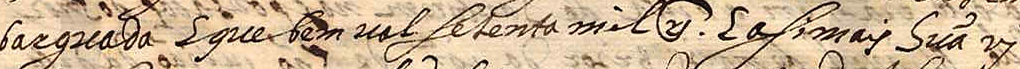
barguada E que bem ual setenta mil r̄s. E asi mais huā vj
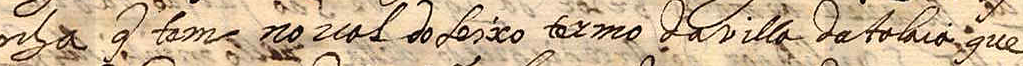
nha q̄ tem no ual do seixo termo da villa datalaia que
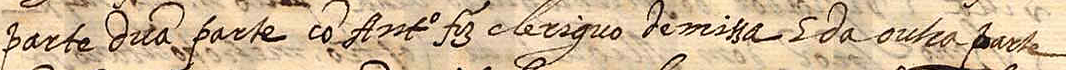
parte duā parte cō Anto frz̄ cleriguo de missa E da outra parte
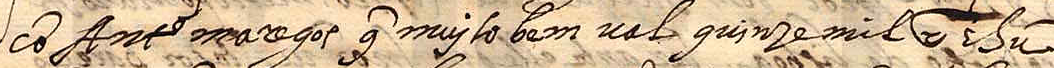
cō Anto maregos q̄ mujto bem ual quinze mil r̄s E hū
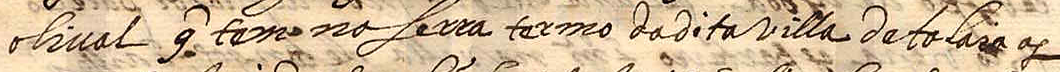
oliual q̄ tem na Serra termo da dita villa de talaia as
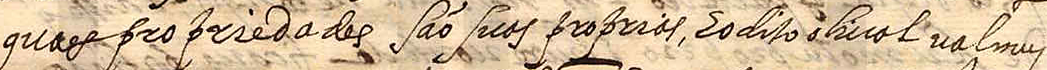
quaes propriedades saõ suas proprias, E o dito oliual ual muj
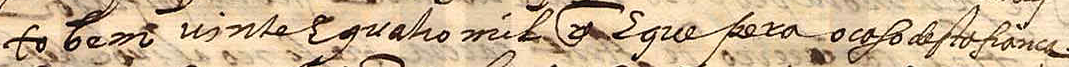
to bem uinte E quatro mil r̄s E que pera o caso desta fiança
